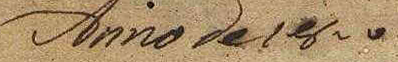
Anno de 1810
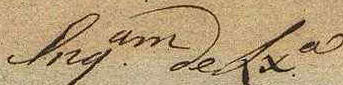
Inq.am de Lx.a
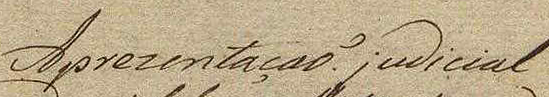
Aprezentaçaõ judicial
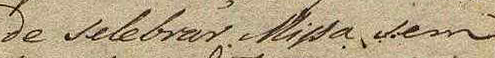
de selebrar Missa sem
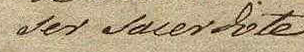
ser sacerdote
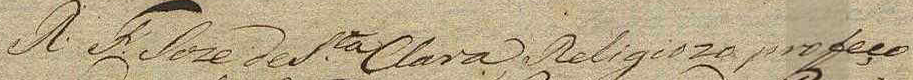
R. Fr. Ioze de S.ta Clara, Religiozo profeço
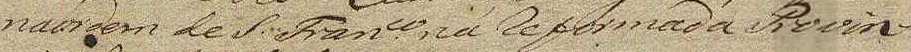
na ordem de S. Fran.co na Reformada Provin
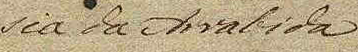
sia da Arrabida
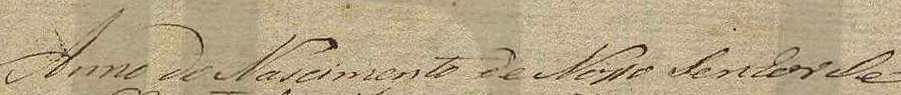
Anno do Nascimento de Nosso Senhor Ie
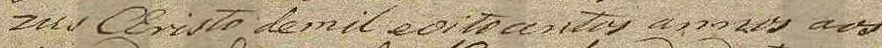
zus Christo de mil e oitocentos annos aos
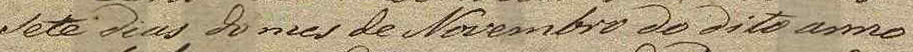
sete dias do mes de Novembro do dito anno
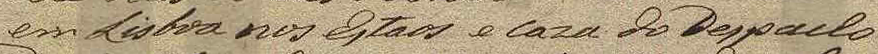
em Lisboa nos Estaos e caza do Despacho
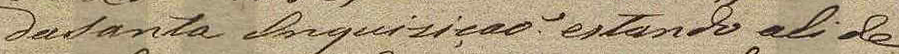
da santa Inquiziçaõ estando ahi de
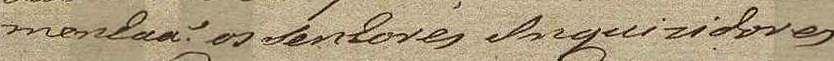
menhaã os senhores Inquizidores
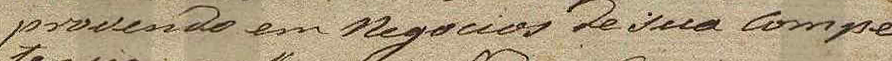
provendo em negocios de sua compe
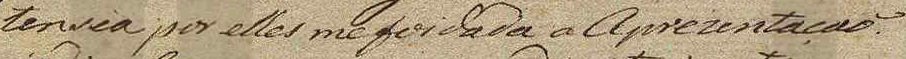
tensia por elles me foi dada a Aprezentaçaõ
